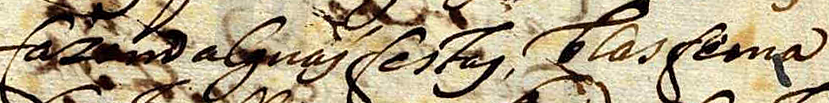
fazem alguas̄ festas, blasfema
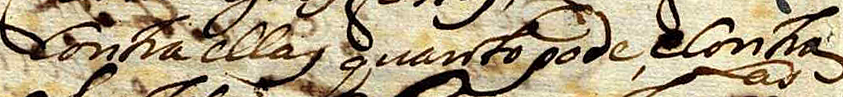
Contra ellas quanto pode, e Contra
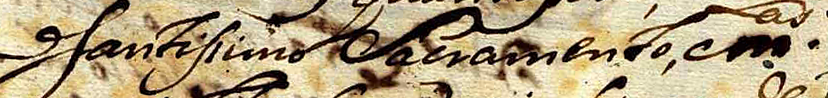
o santissimo Sacramento, e mtas.
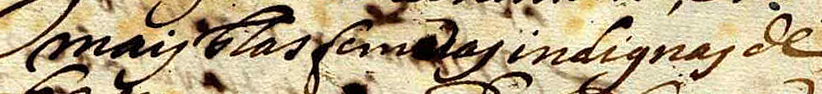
mais blasfemeas indignas de
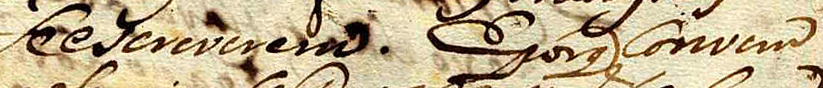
se escreverem. E porq̄ Convem
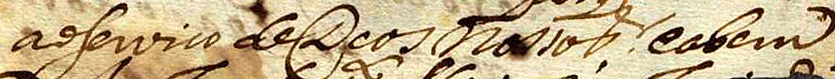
ao serviço de Deos nosso s.or, e a bem
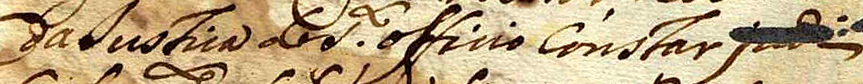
da Iustiça do s.to officio constar judi
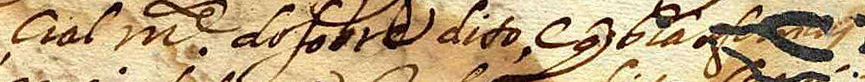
cialm.te do sobredito, e q̄ blasfemias
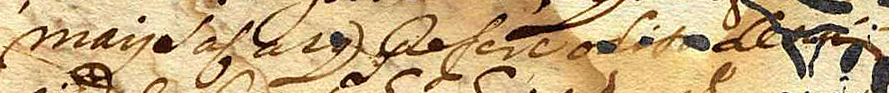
mais saõ as q̄ profere o dito denu
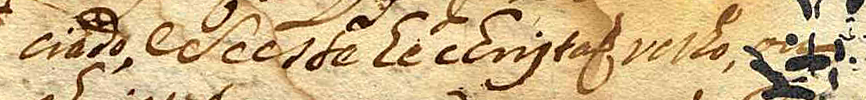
ciado, e se este hé christaõ velho, ou
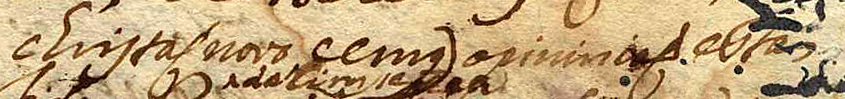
christaõ novo, e em q̄ opininiaõ esta
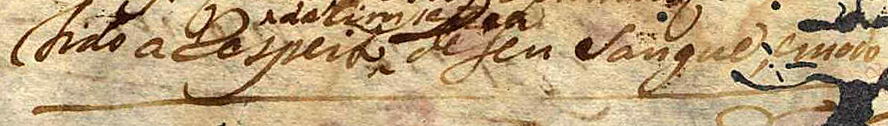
tido a Respeito de seu sangue, e modo
